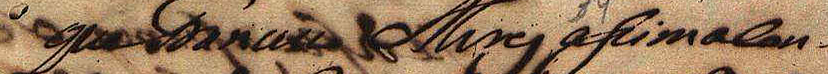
que Francisco Alvres assima con
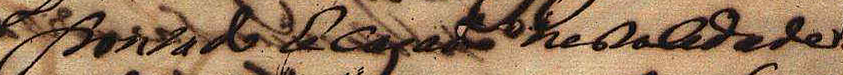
frontado he cazado nesta cidade
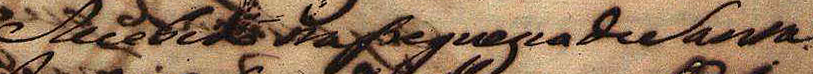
e Recebido na freguezia de Santa
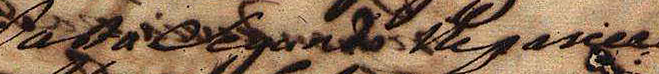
Iusta Segundo lhe pasce
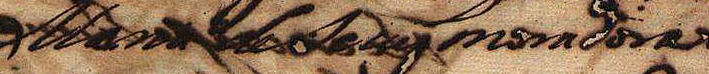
Maria de Iesus moradora
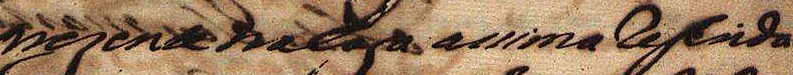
prezente na caza assima Referida
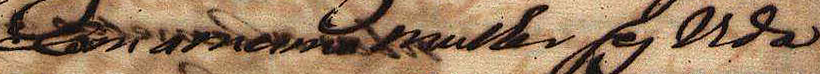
E com a mesma mulher fes Vida
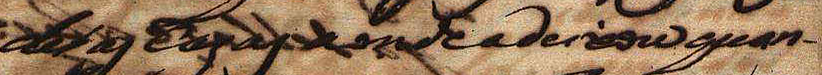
zas donde a deixou quan
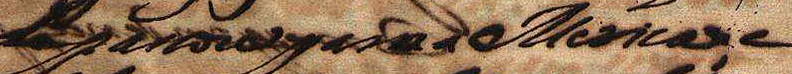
do passou para aMerica, e
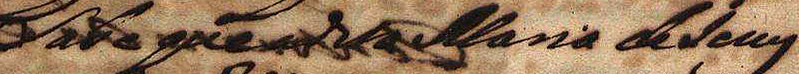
Sabe que a dita Maria de Iesus
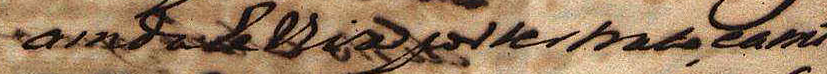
ainda he Viva por ter trato, e ami
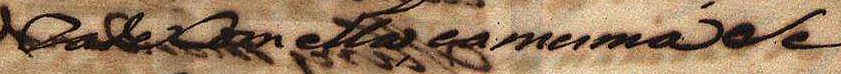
zade com ella, e a mesma Se
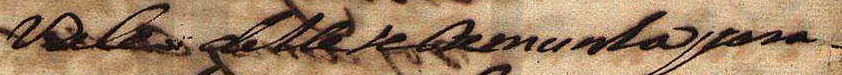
Valeo delle testemunha para
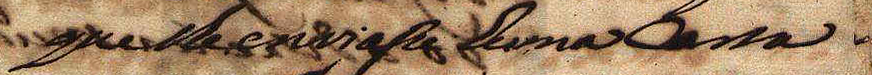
que lhe enviasse huma carta
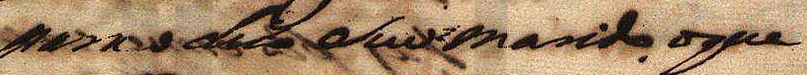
para o dito seu marido o que
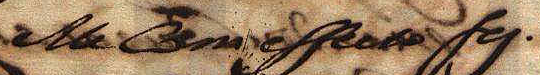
elle com effeito fes.
